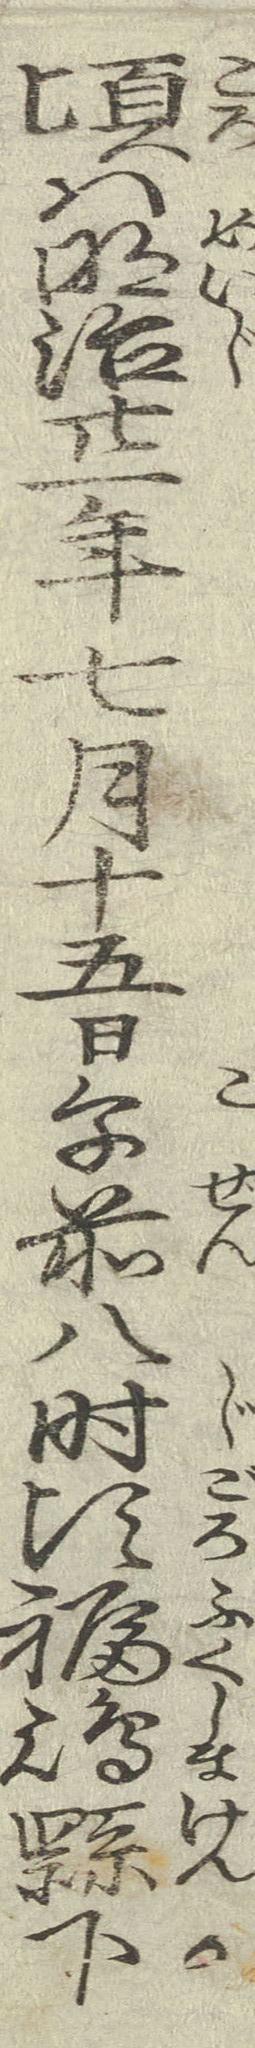頃は明治廿一年七月十五日午前八時頃福島県下
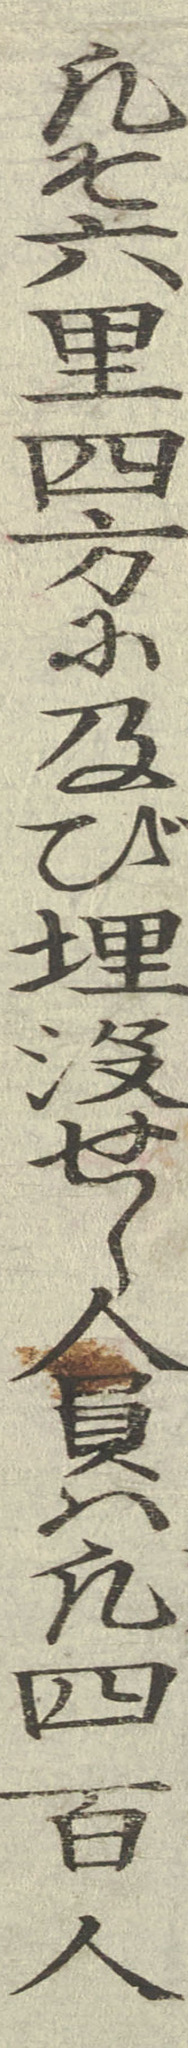凡そ六里四方に及び埋没せし人員は凡四百人
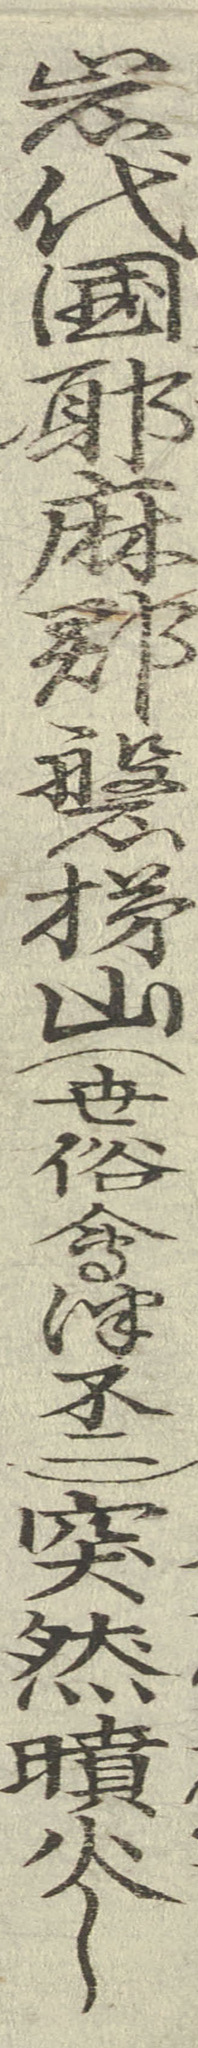岩代国耶麻郡磐梯山(世俗会津不二)突然噴火し
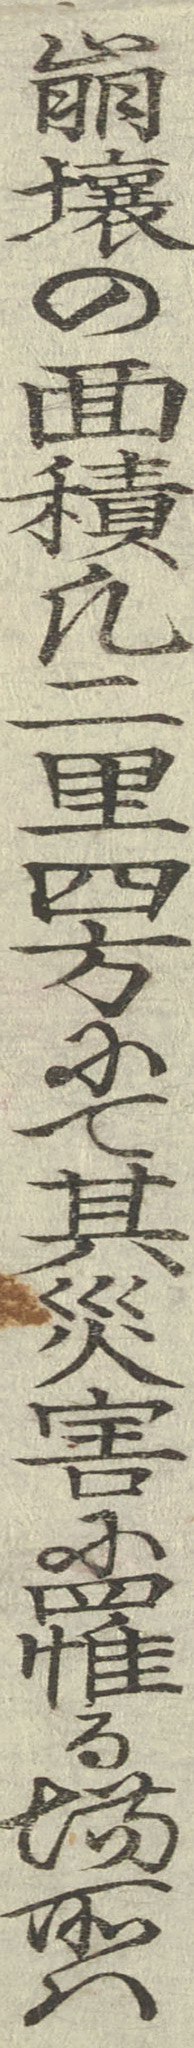崩壊の面積凡二里四方にて其災害に罹る場所は
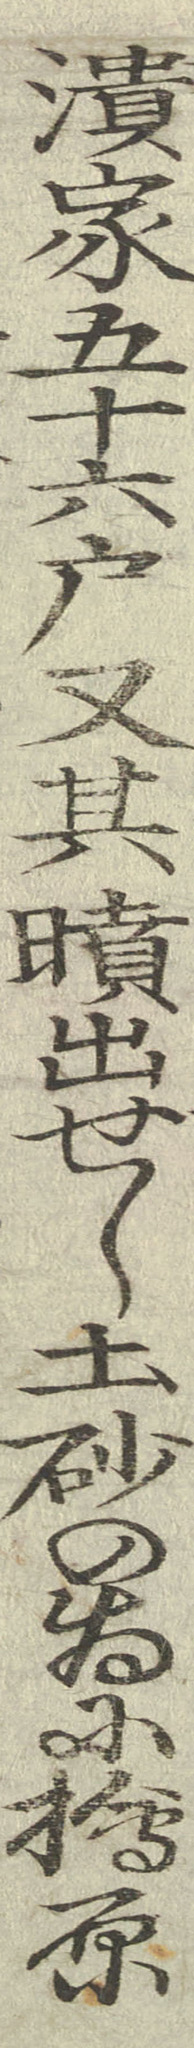潰家五十六戸又其噴出せし土砂の為に檜原
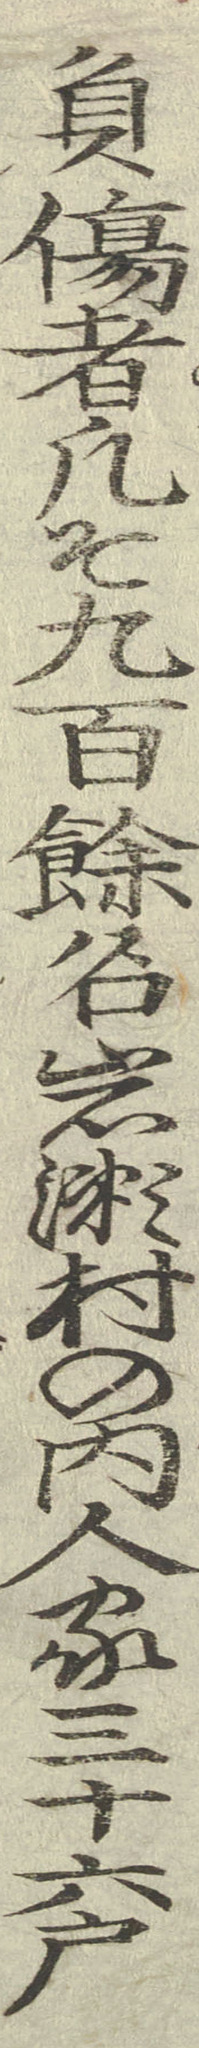負傷者凡そ九百余名岩瀬村の内人家三十六戸
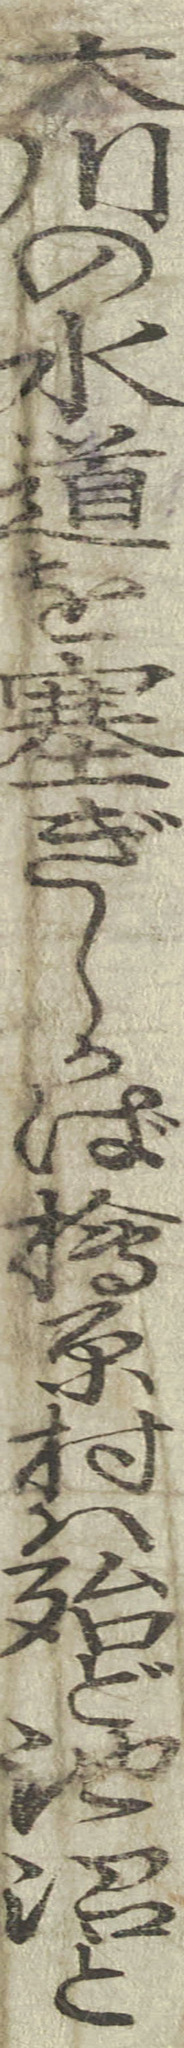大川の水道を塞ぎしかば檜原村は殆ど池沼と
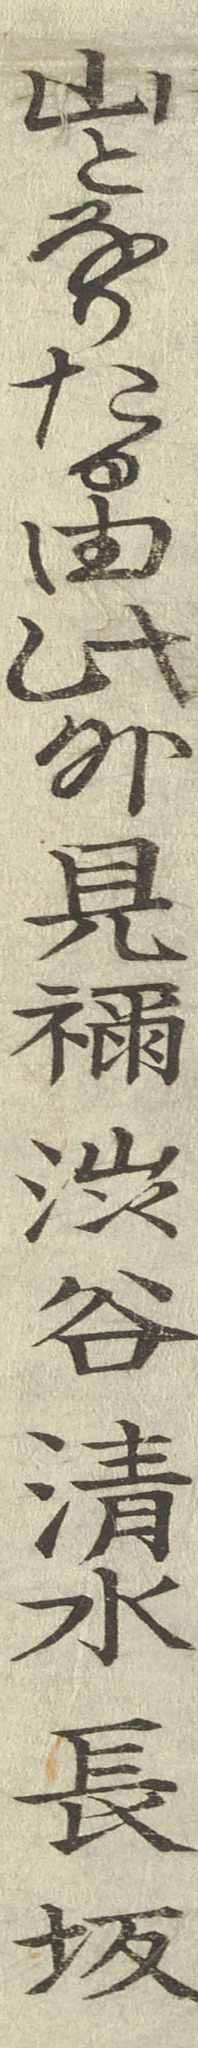山となりたる由此外見禰渋谷清水長坂
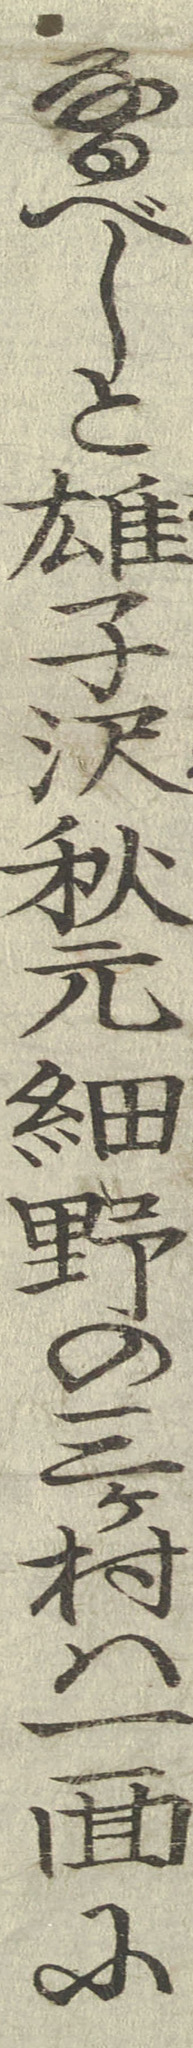なるべしと雄子沢秋元細野の三ケ村は一面に
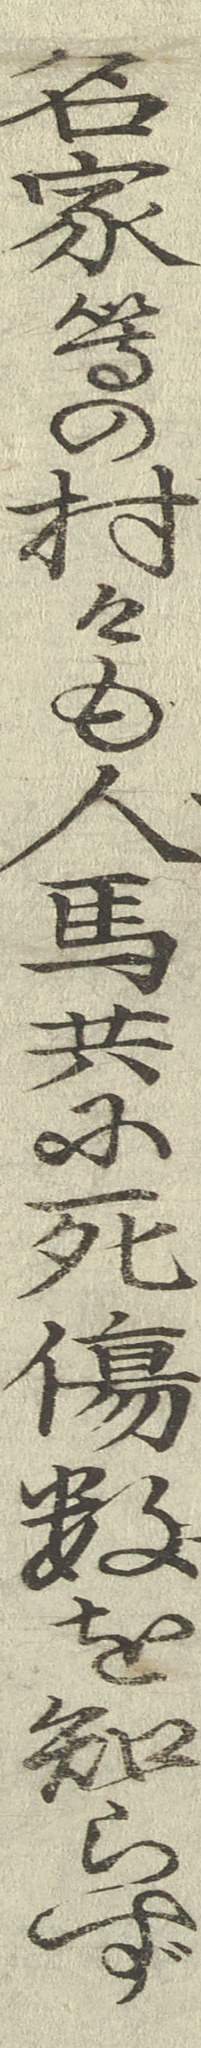名家等の村々も人馬共に死傷数を知らず
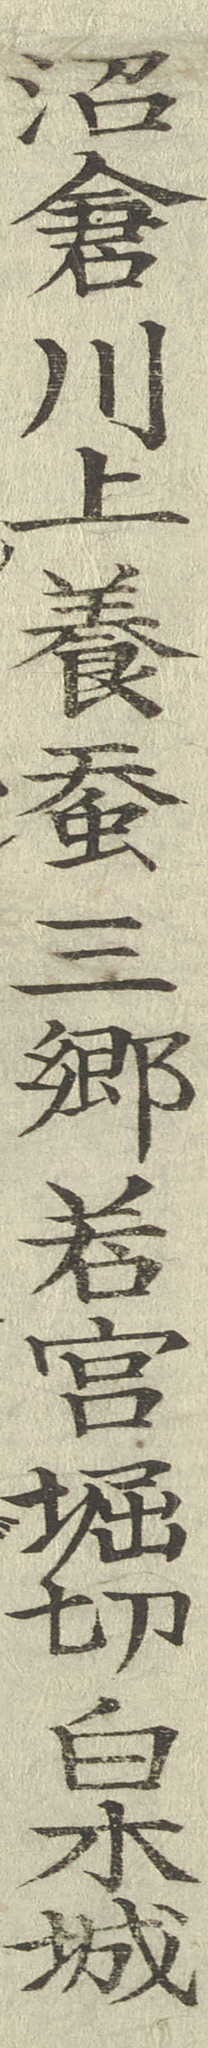沼倉川上養蚕三郷若宮堀切白木城
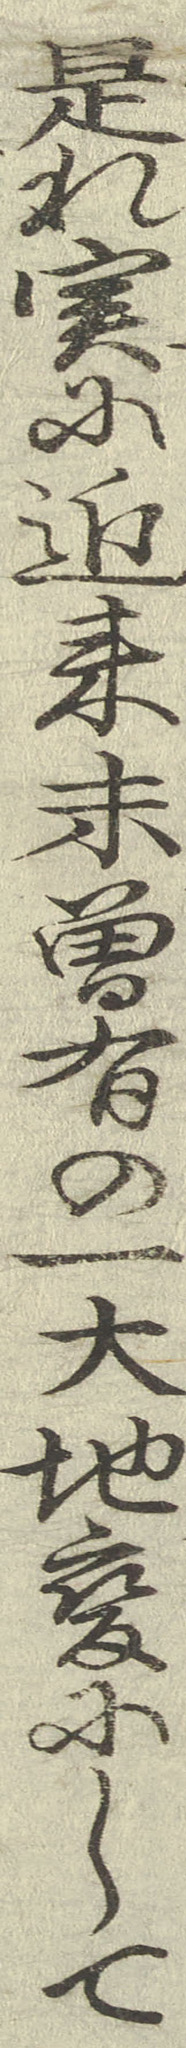是れ実に近来未曾有の一大地変にして
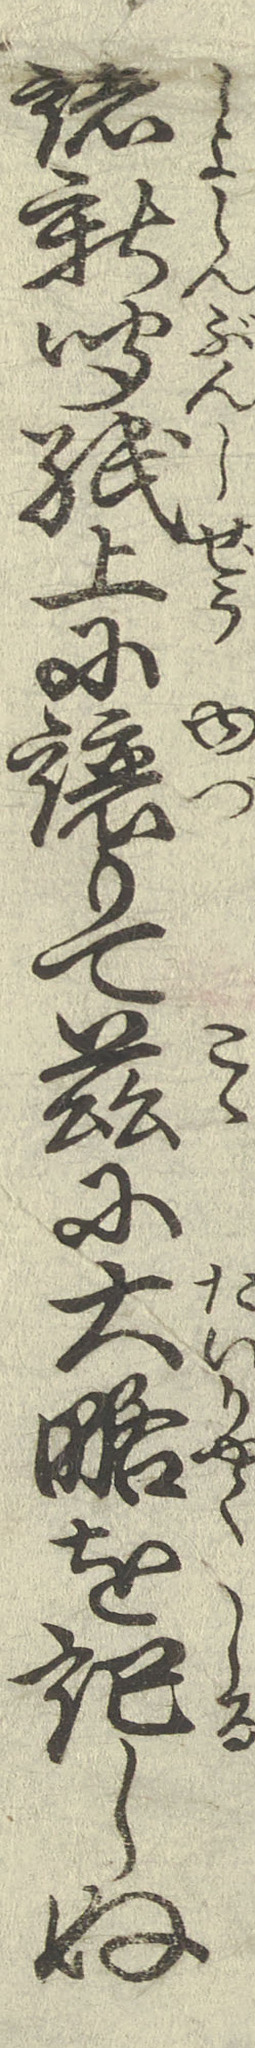諸新聞紙上に譲りて茲に大略を記しぬ
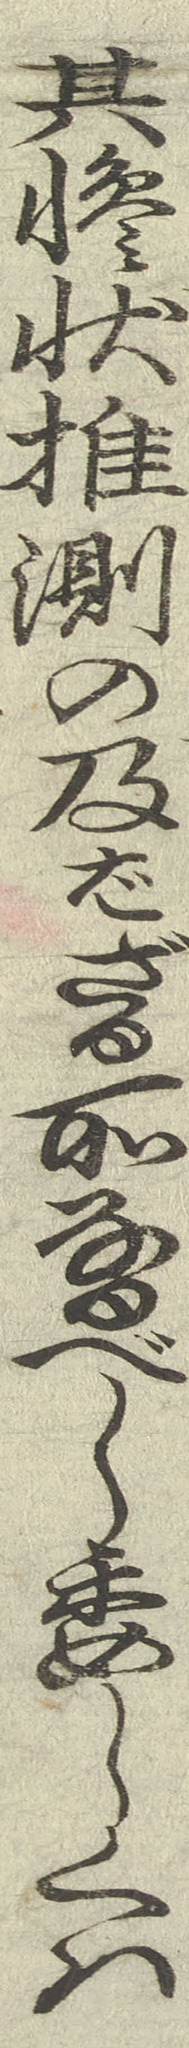其惨状推測の及ばざる所なるべし委しくは
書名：磐梯山噴火略図
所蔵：東京大学総合図書館 General Library in the University of Tokyo, JAPAN
